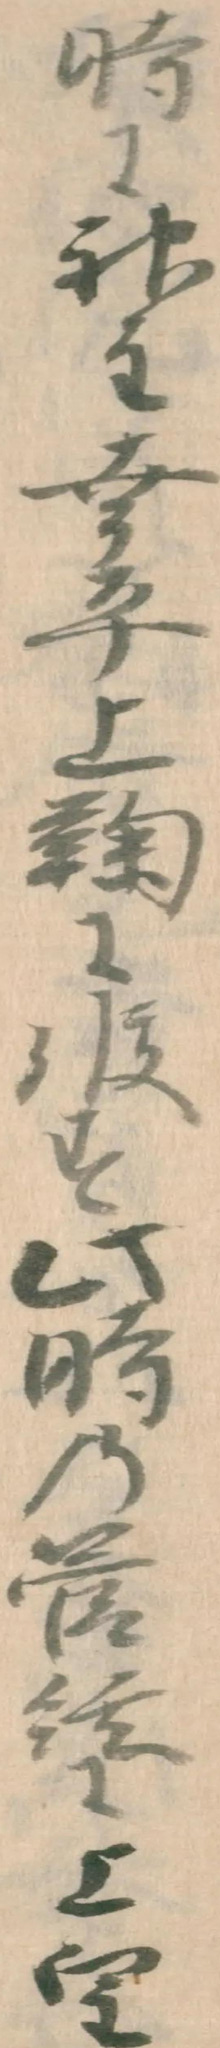時に神主幸平上鞠に候す此時の管絃に上皇
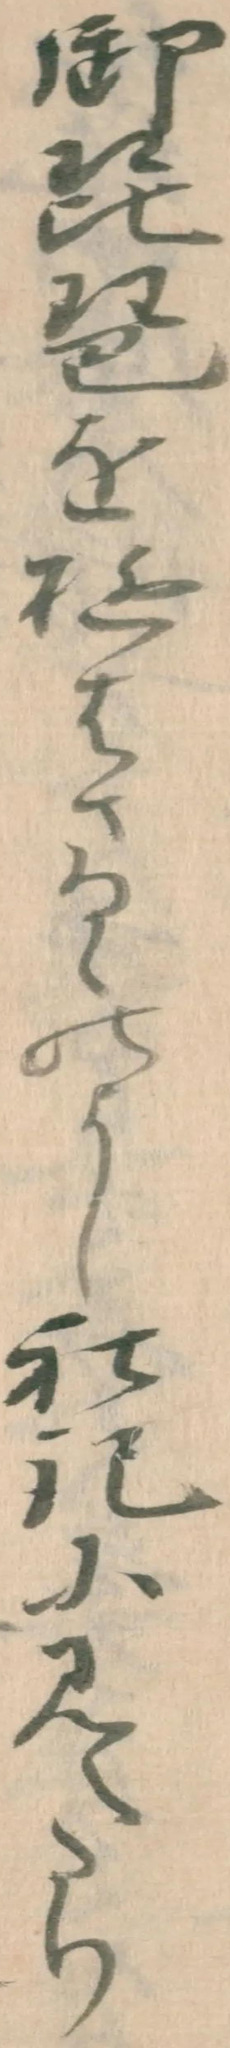御琵琶を遊はさるゝのよし社記に見えたり
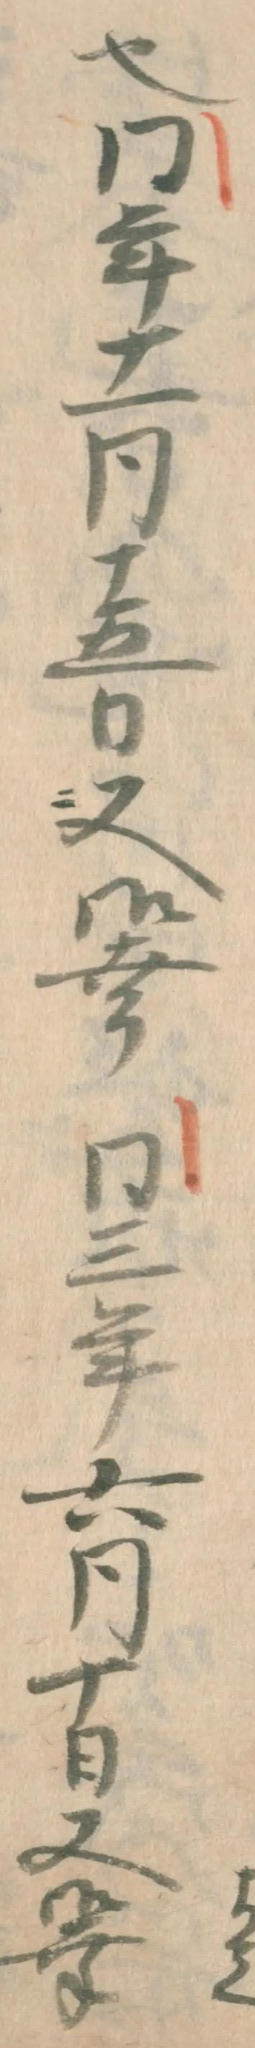也同年十一月十五日又御幸同三年六月十日又御幸
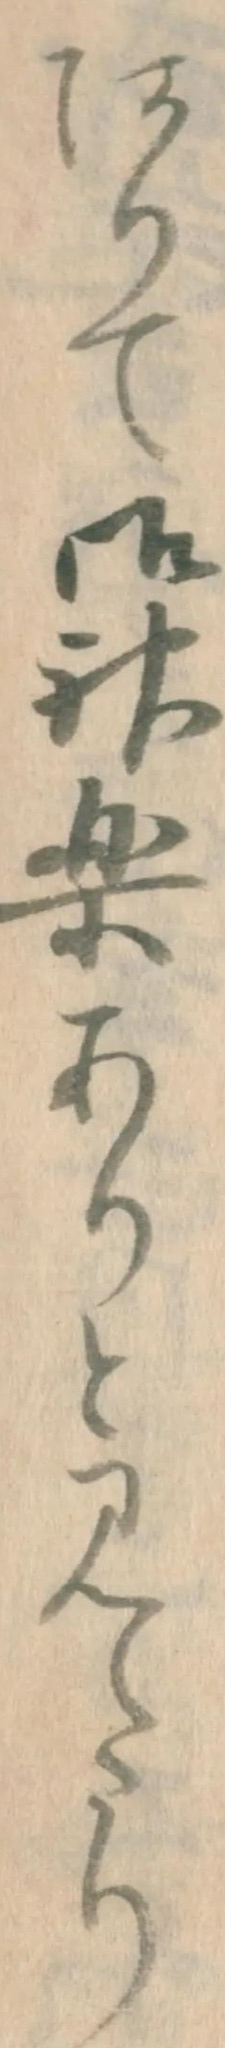ありて御神楽ありと見えたり

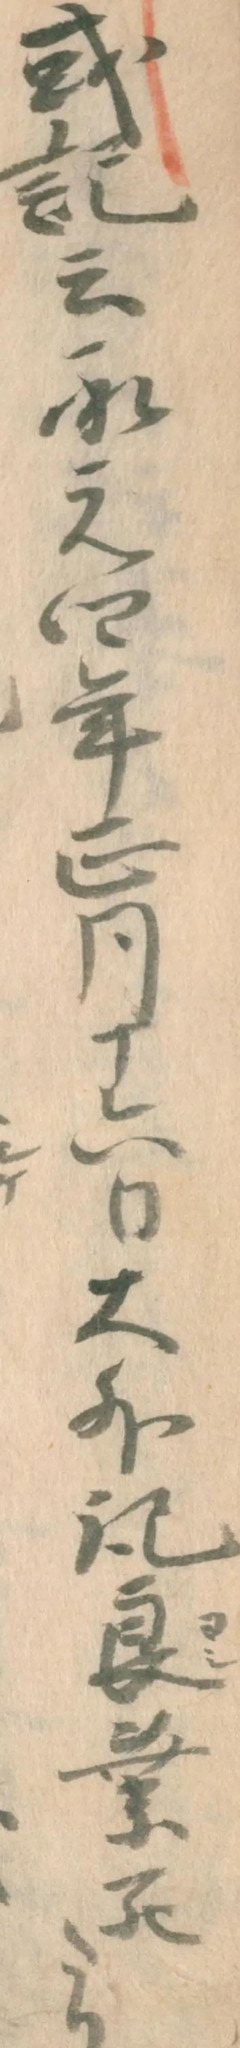或記云承元四年正月十六日大外記良業死たり
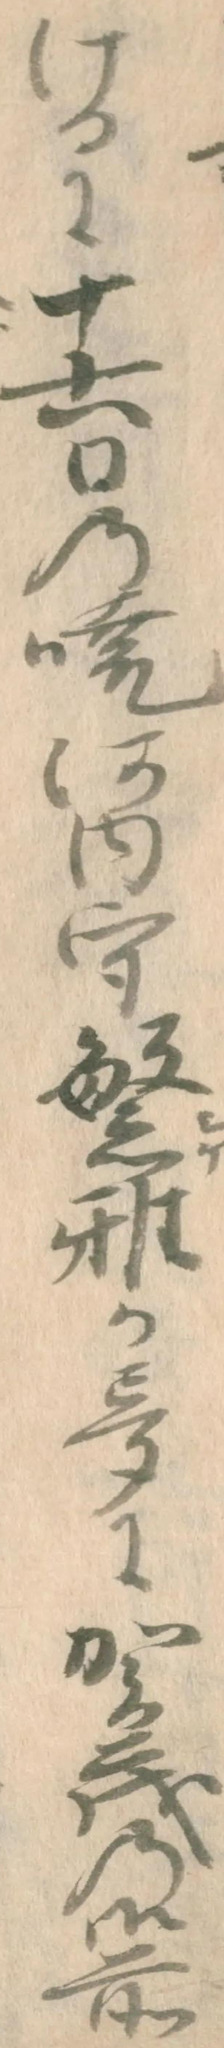けるに十六日の暁河内守繁雅か夢に賀茂の御前
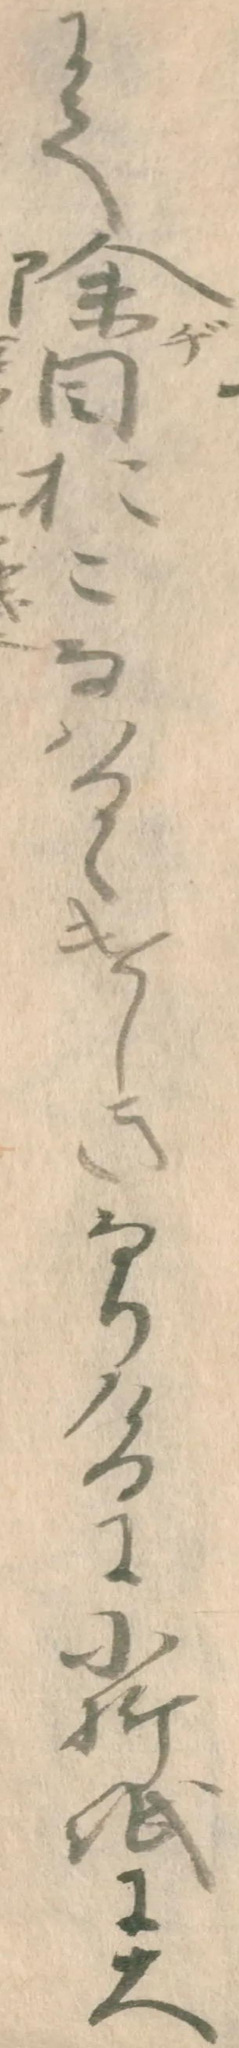にて除目おこなはるゝけしきなりけるに小折紙に大
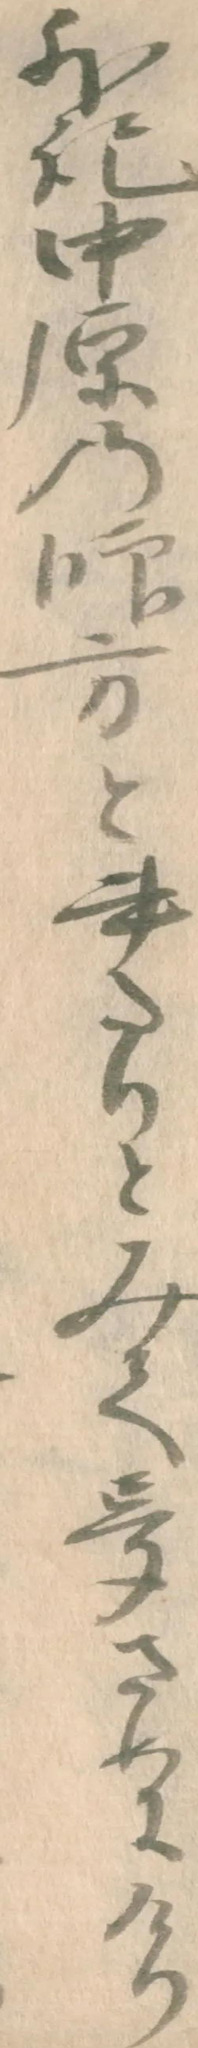外記中原の師方と書たりとみて夢さめにけり
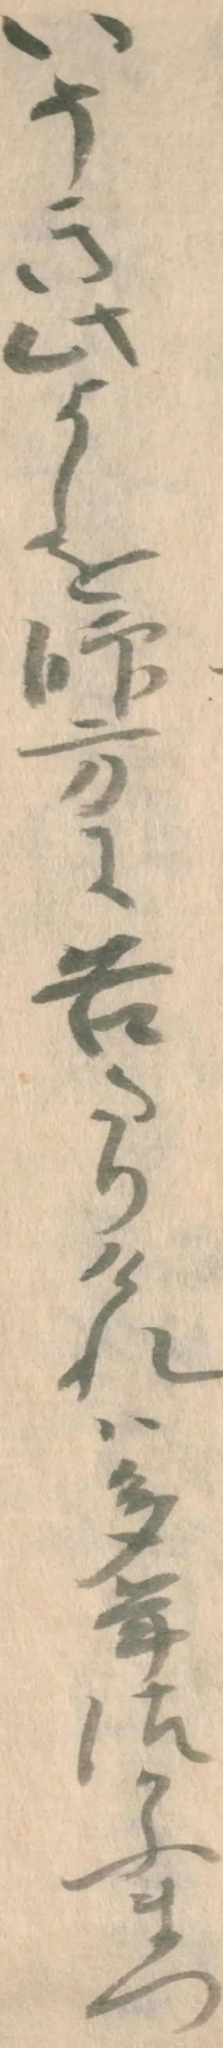いそき此よしを師方に告たりけれは多年つかふまつ
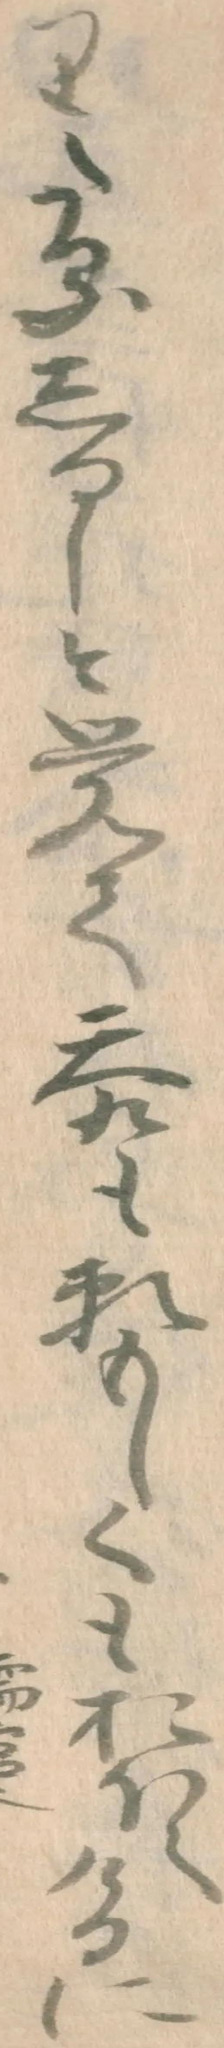りたるしるしと覚て忝も頼もしくもおほえけるに
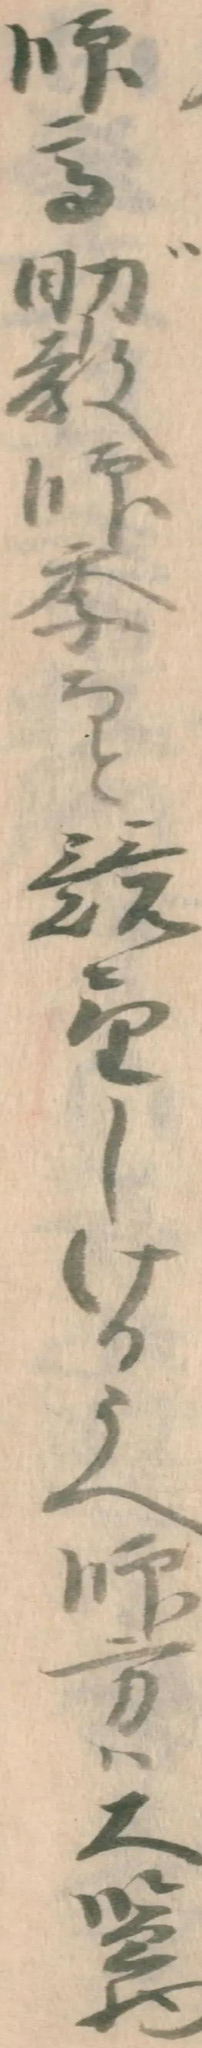師高助-教師季なと競望しけるうへ師方は大監物
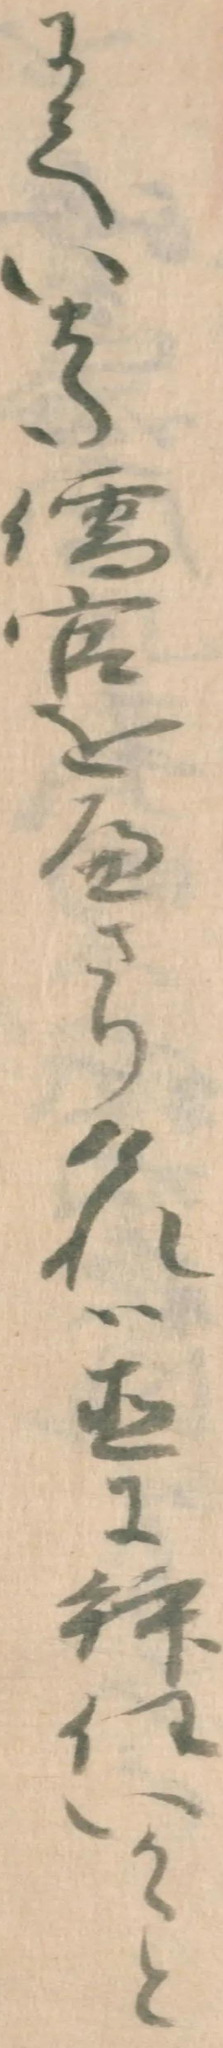にていまた儒官をへさりけれは直に拝任いかゝと
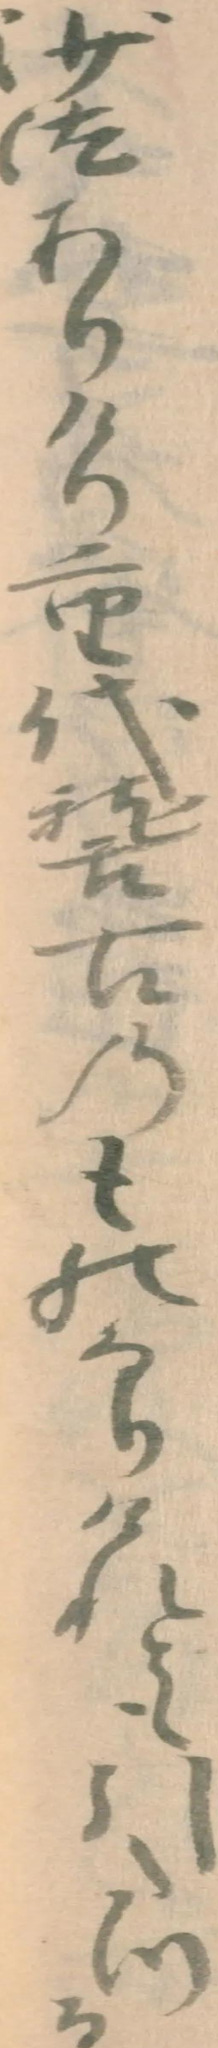沙汰ありけり重代稽古のものなりけれとも引たつる
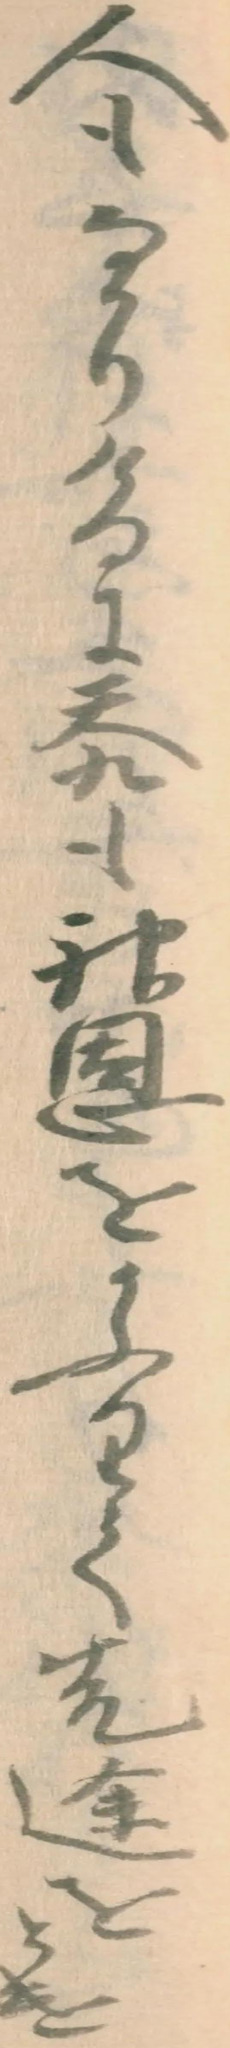人もなかりけるに忝も神恩をかふりて先途をとけ
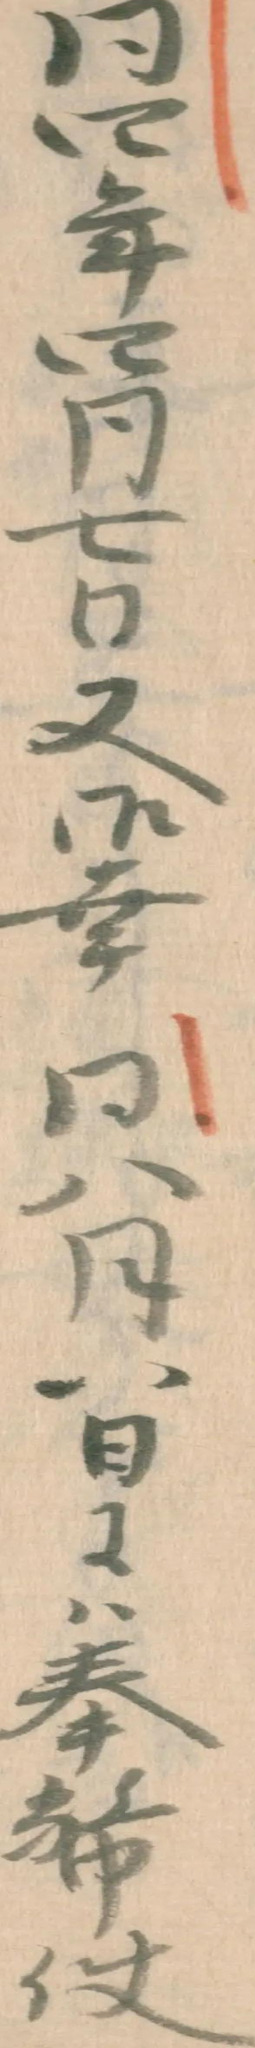同四年四月七日又御幸同八月八日には奉幣使
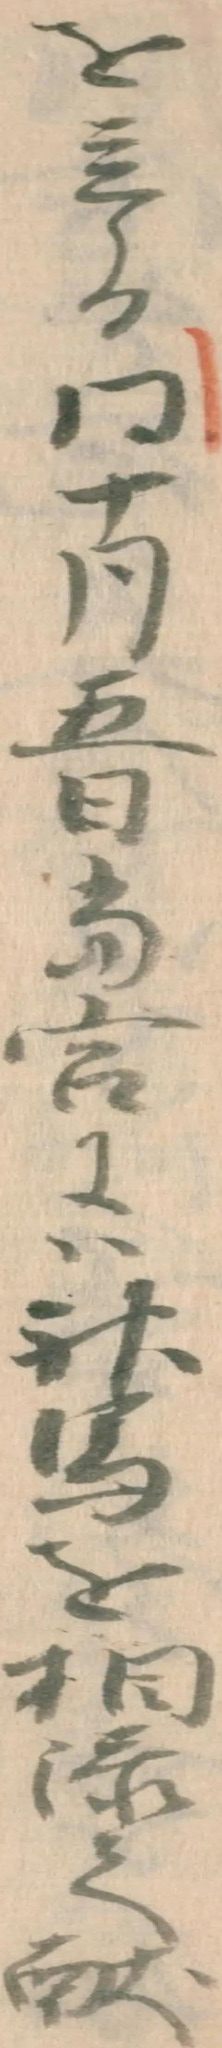を立らる同十月五日当宮には神馬を相添て献
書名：賀茂社記録. 第1冊
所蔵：国立国会図書館 National Diet Library, JAPAN
